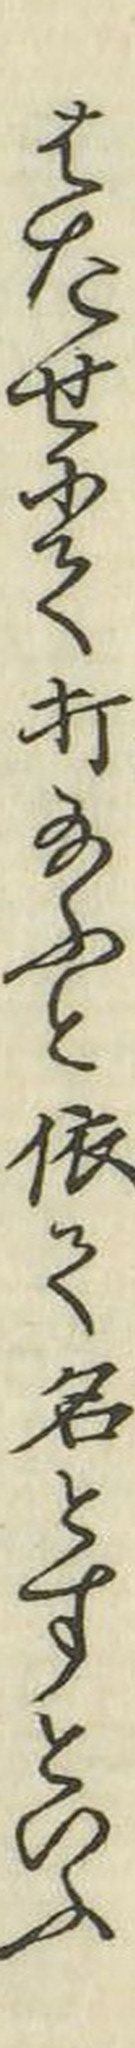はたせにて打給ふと依て名とすといふ
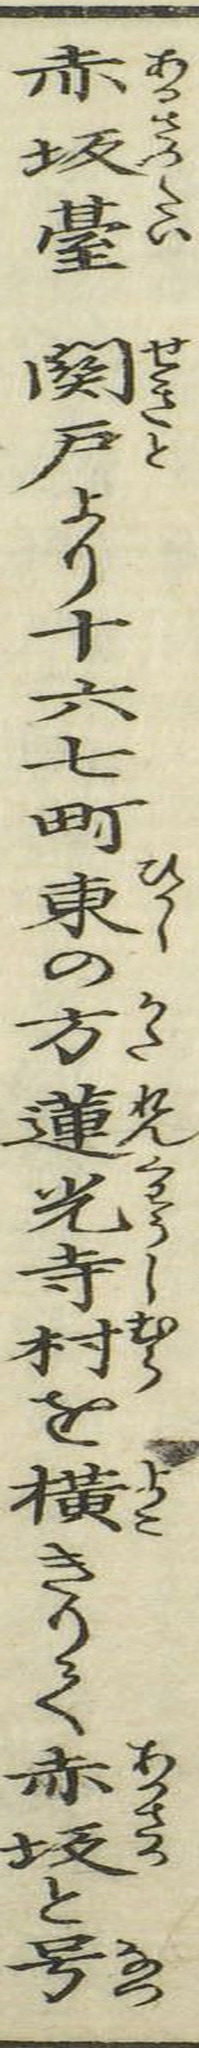赤坂台関戸より十六七町東の方蓮光寺村を横きりて赤坂と号
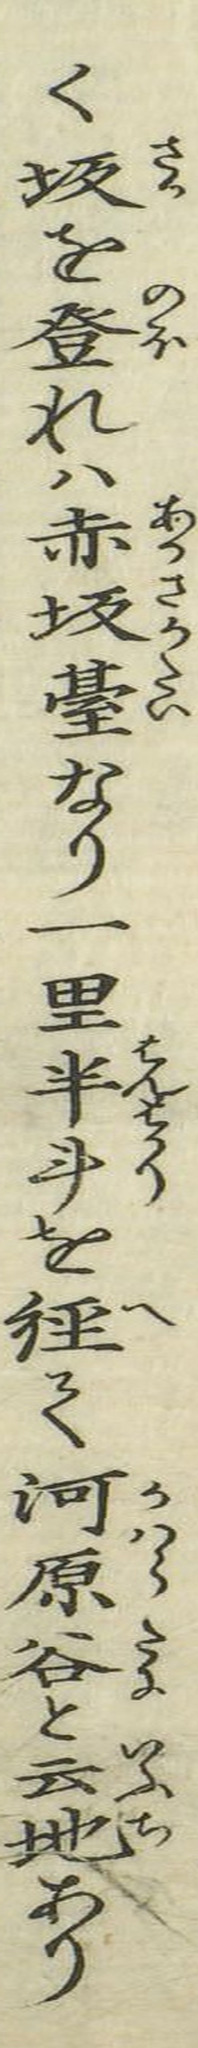く坂を登れは赤坂台なり一里半斗を経て河原谷と云地あり
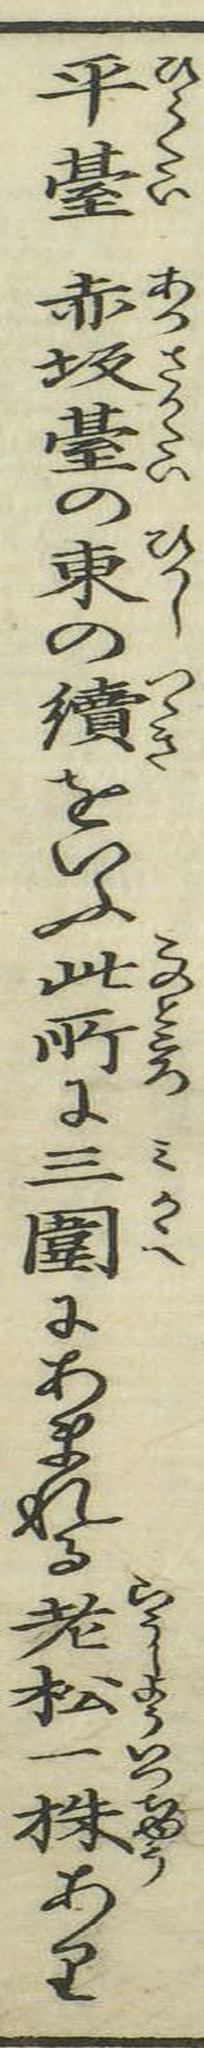平台赤坂台の東の続をいふ此所に三圍にあまれる老松一株あり

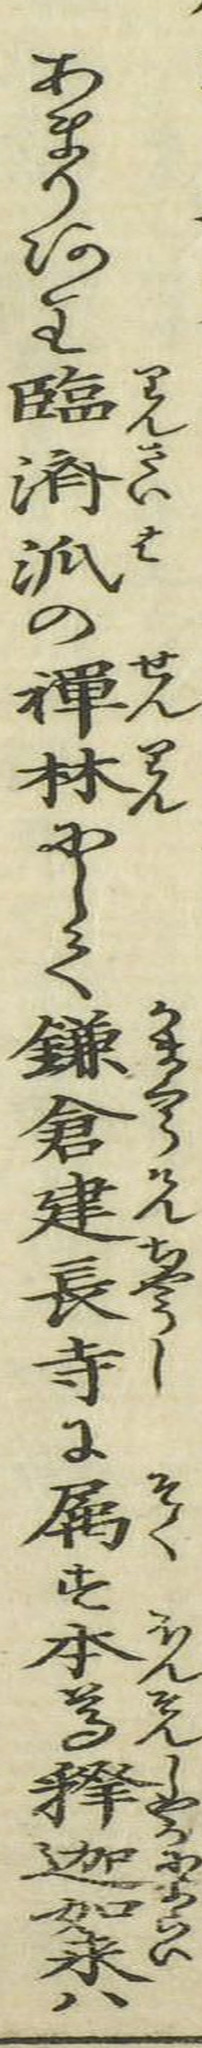あまりあり臨済派の禅林にして鎌倉建長寺に属す本尊釈迦如来は
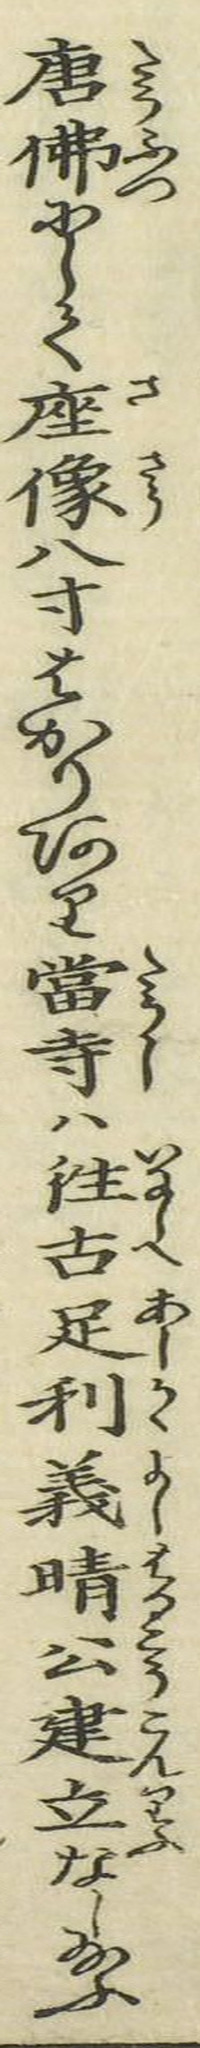唐佛にして座像八寸はかりあり当寺は往古足利義晴公建立なし給ふ
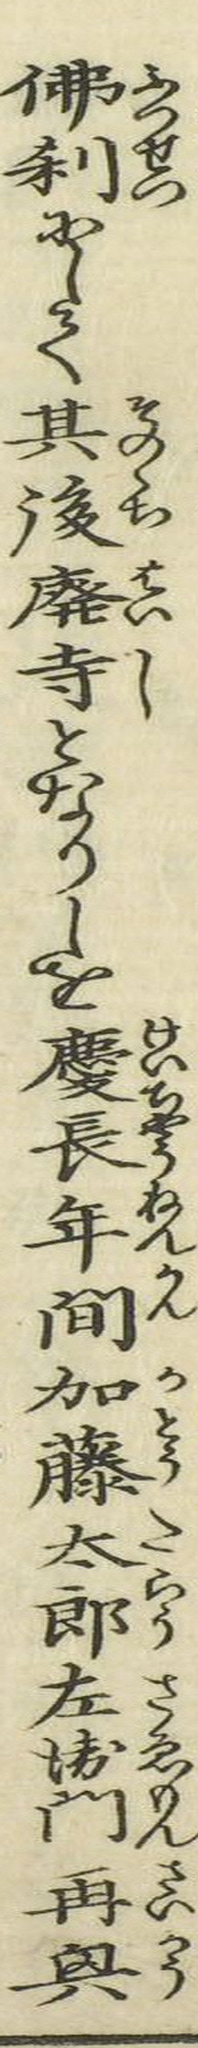佛刹にして其後廃寺となりしを慶長年間加藤太郎左衛門再興
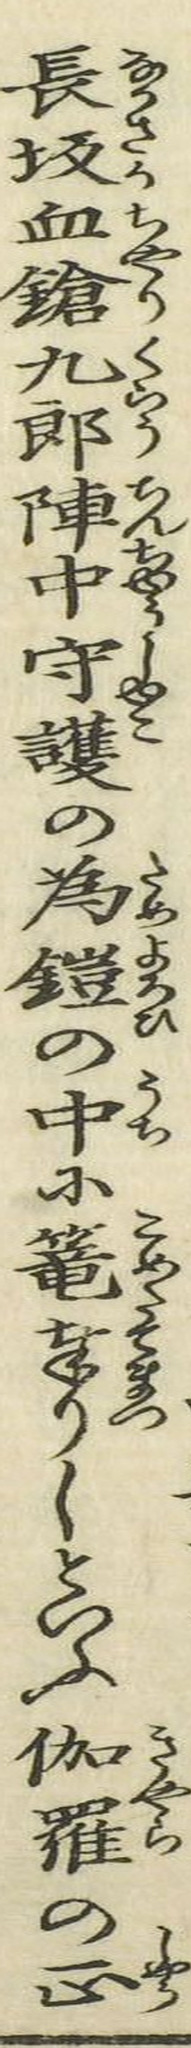長坂血鎗九郎陣中守護の為鎧の中に篭奉りしといふ伽羅の正
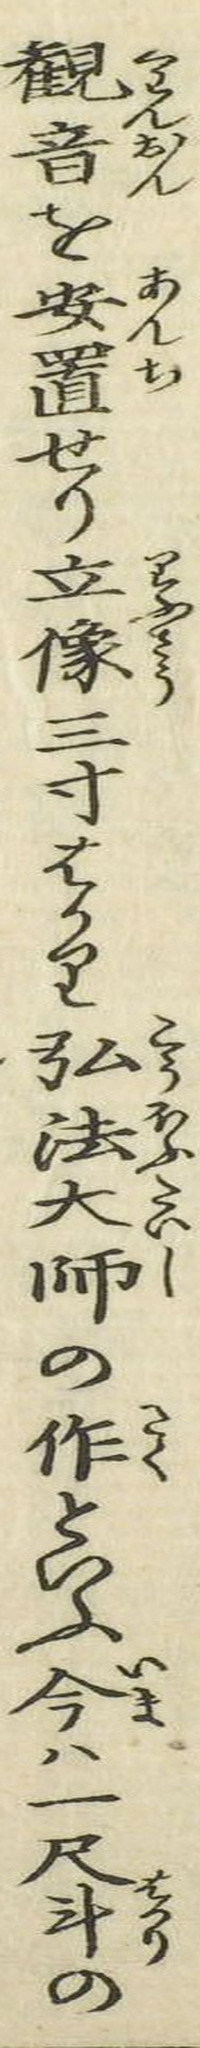観音を安置せり立像三寸はかり弘法大師の作といふ今は一尺斗の
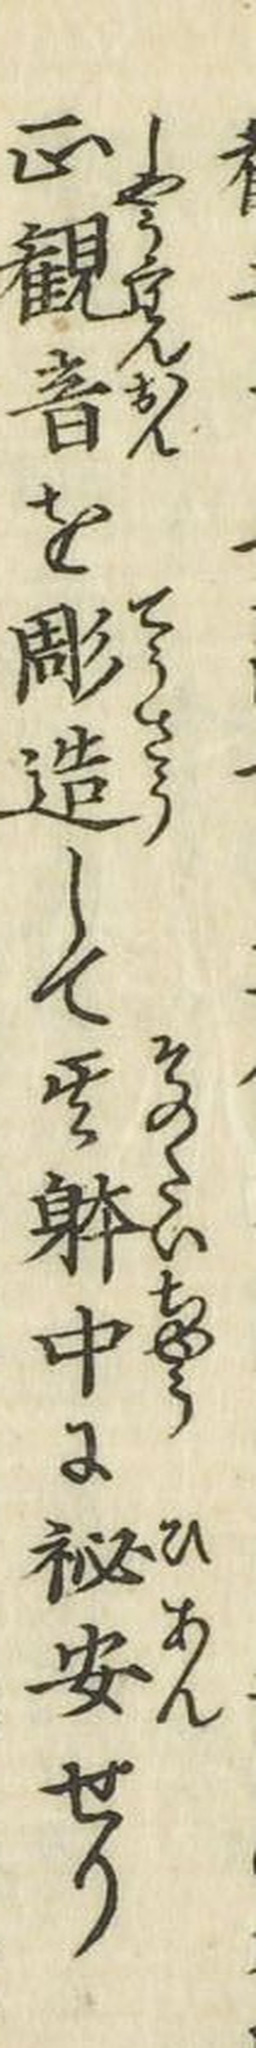正観音を彫造して其躰中に秘安せり
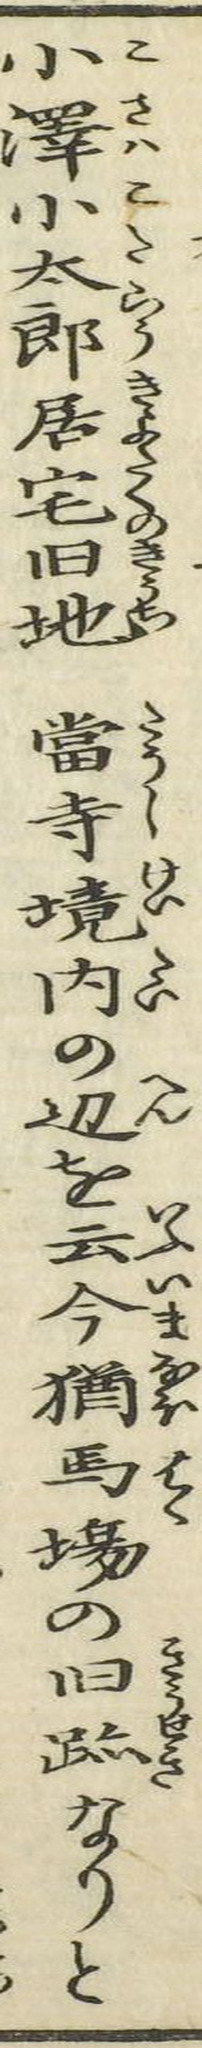小沢小太郎居宅旧地当寺境内の辺を云今猶馬場の旧跡なりと
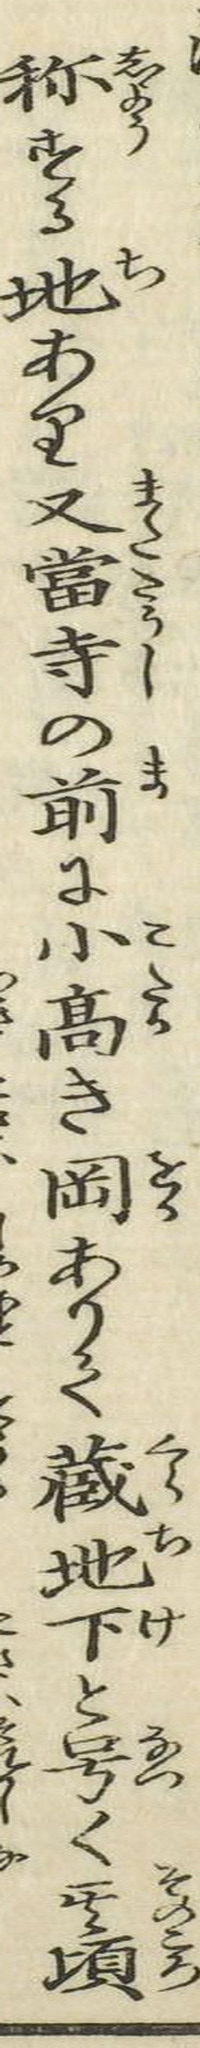称する地あり又当寺の前に小高き岡ありて蔵地下と号く其頃
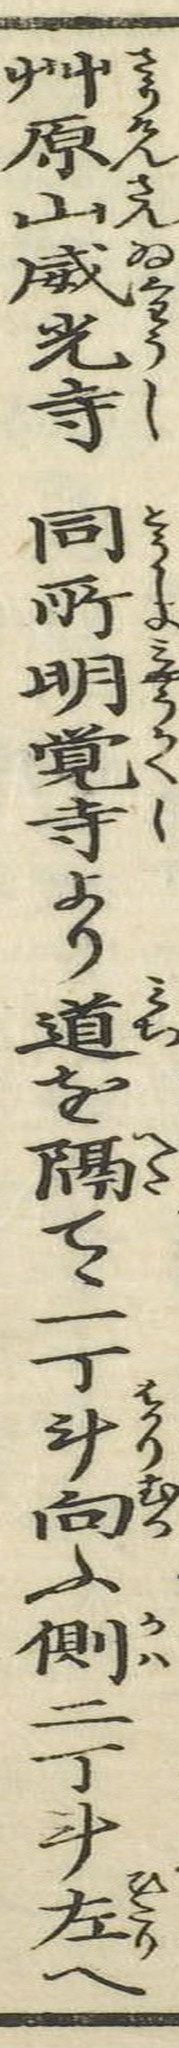艸原山威光寺同所明覚寺より道を隔てゝ一丁斗向ふ側二丁斗左へ
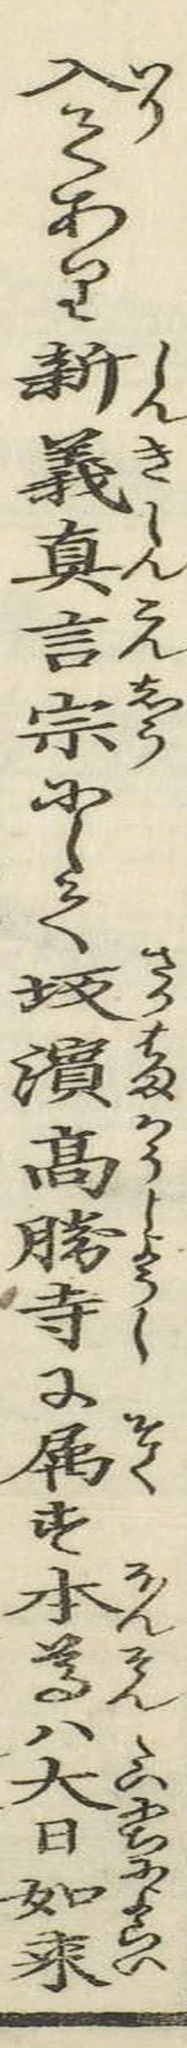入てあり新義真言宗にして坂浜高勝寺に属す本尊は大日如来
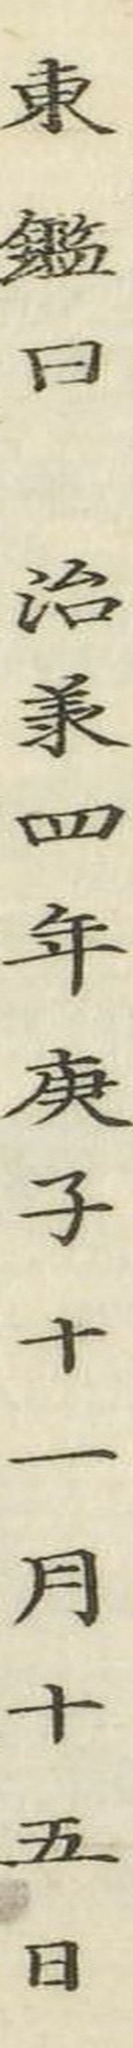東鑑曰治承四年庚子十一月十五日
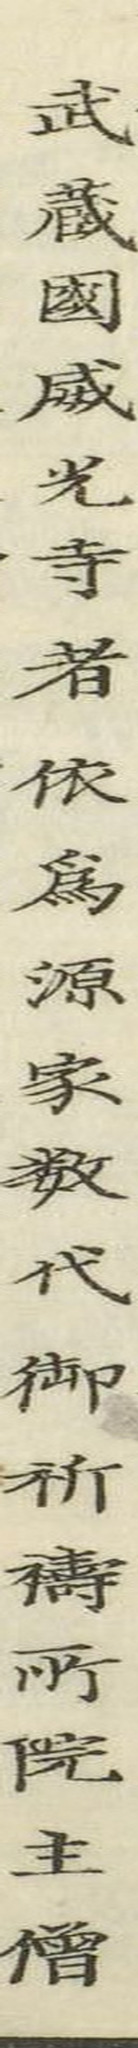武蔵国威光寺者依為源家数代御祈祷所院主僧
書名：江戸名所図会 20巻 巻之10
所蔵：東京学芸大学教育コンテンツアーカイブ
